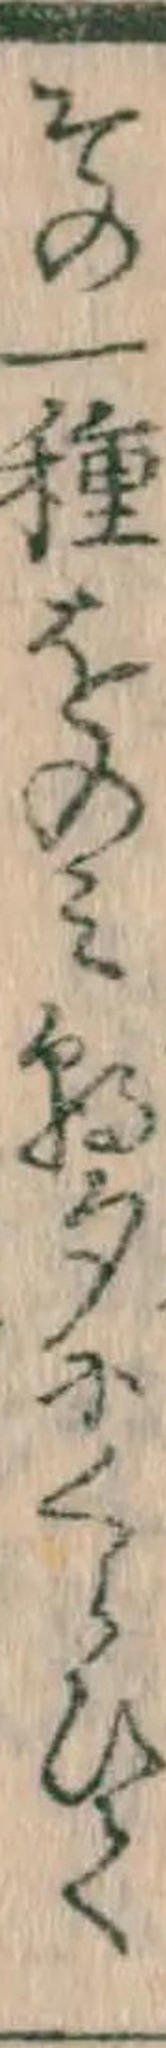その一種をのみ朝夕にくらひて
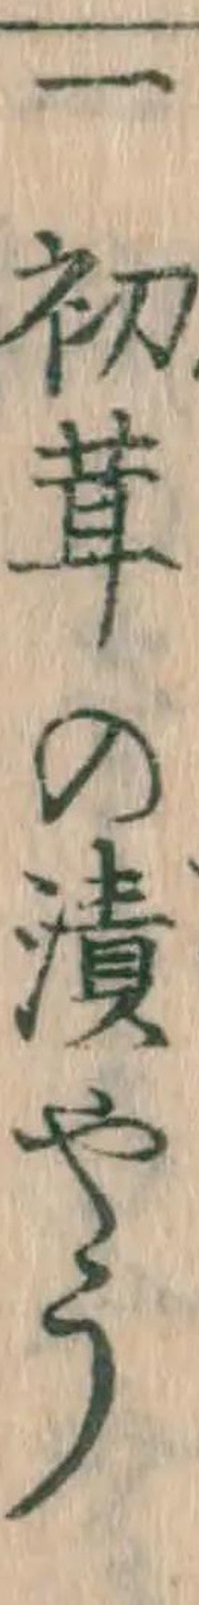一初茸の漬やう
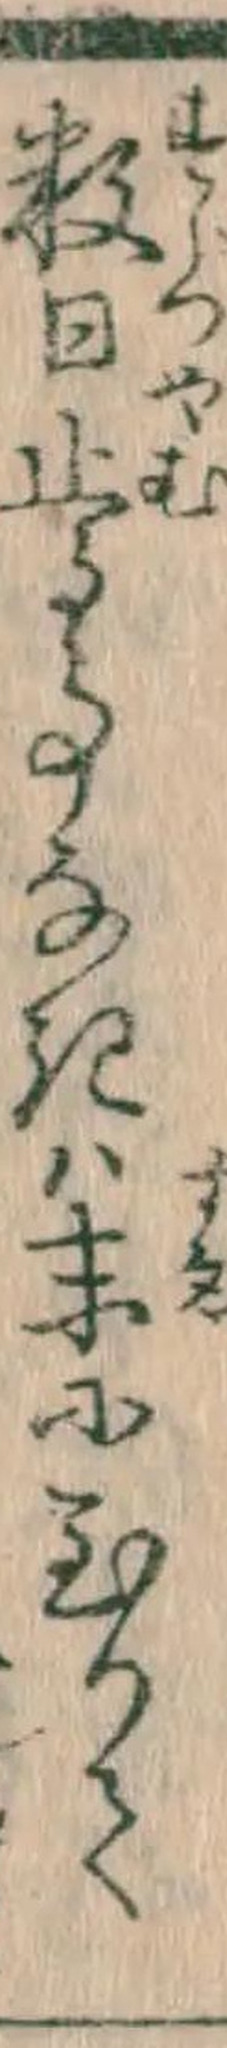数日止る事なきは末に至りて
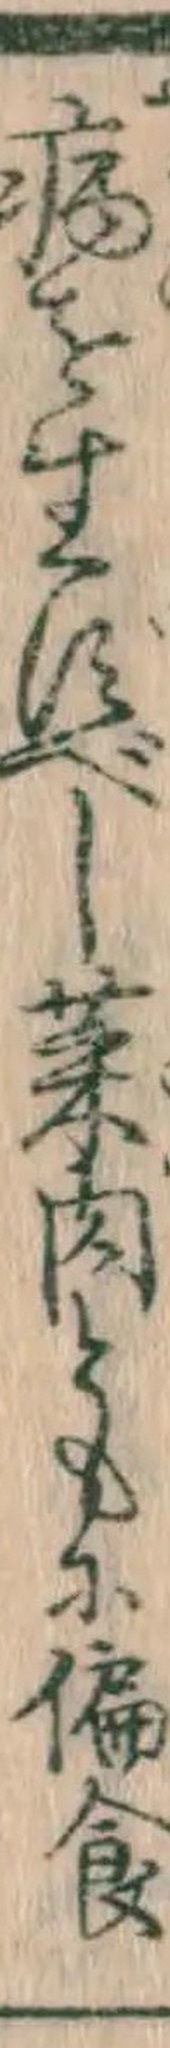病を生ずべし菜肉ともに偏食
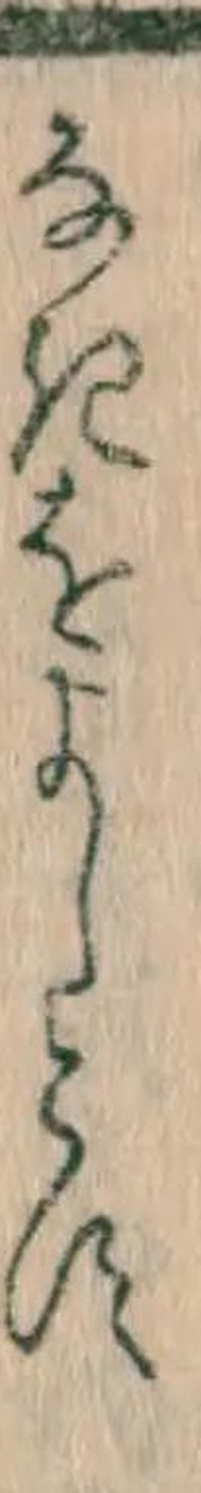なきをよしとす
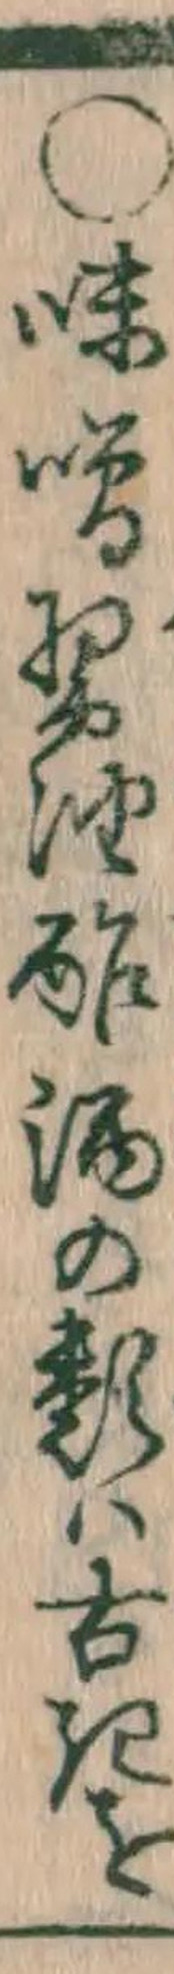○味噌醬油酢酒の類は古きを
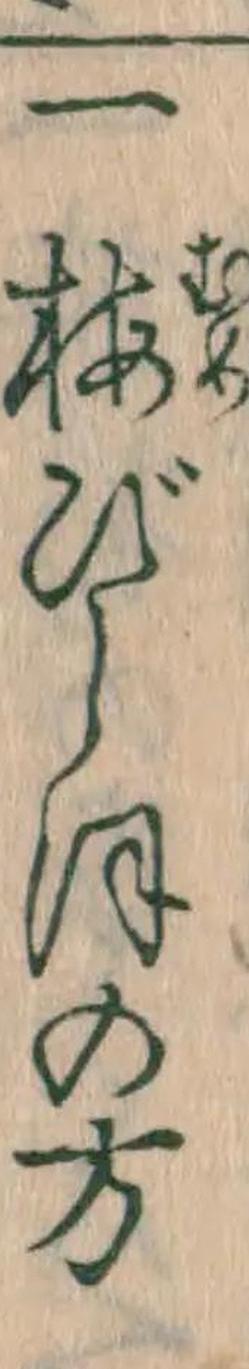一梅びしほの方
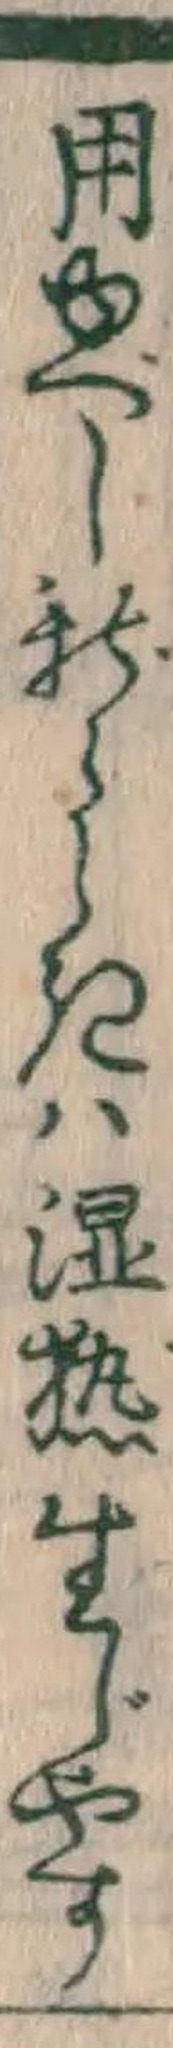用ゆべし新らしきは湿熱生じやす
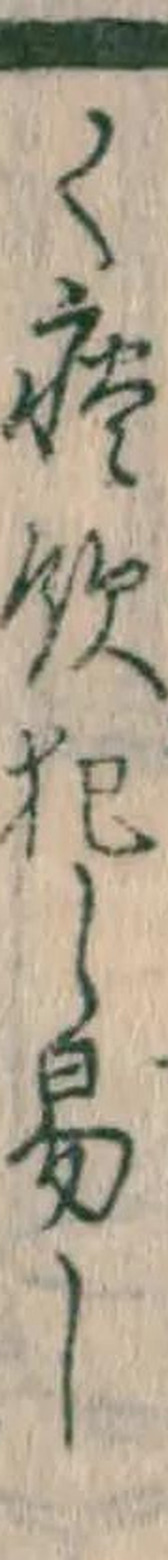く痰飲犯し易し
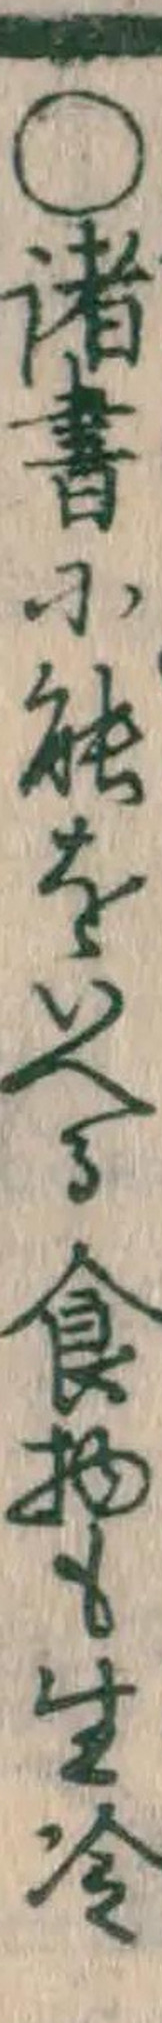○諸書に能をいへる食物も生冷
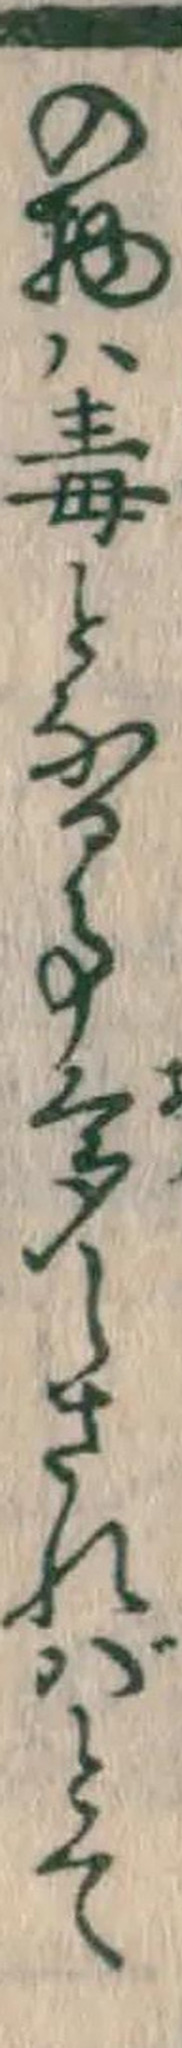の物は毒となる事多しさればとて
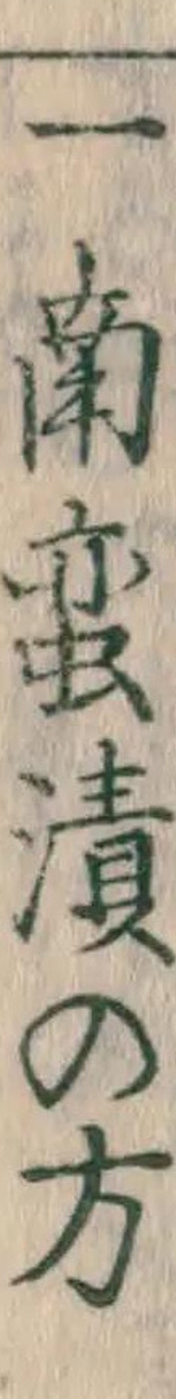一南蛮漬の方
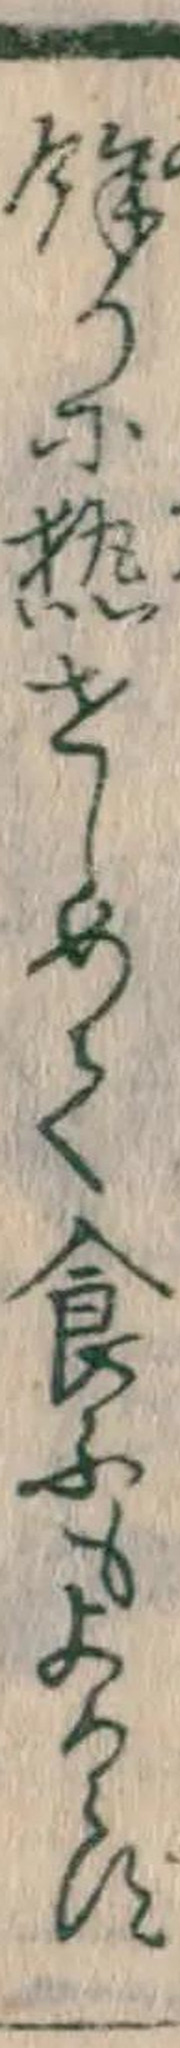余りに熱せしめて食ふもよからず
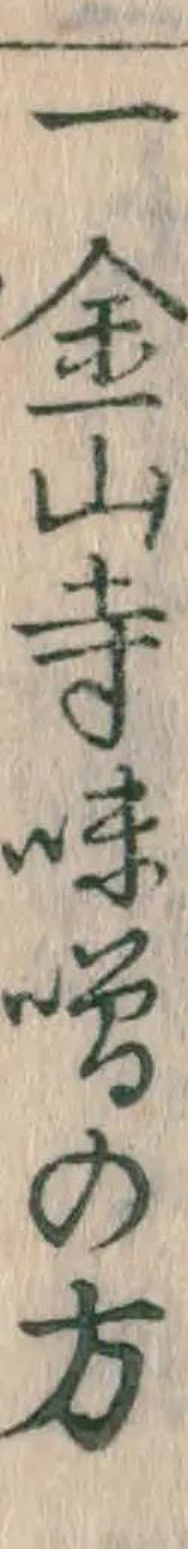一金山寺味噌の方
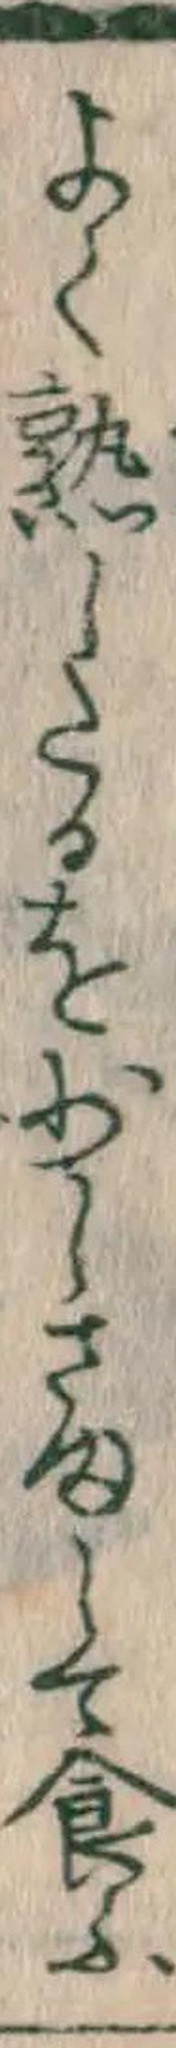よく熟したるを少しさまして食ふ
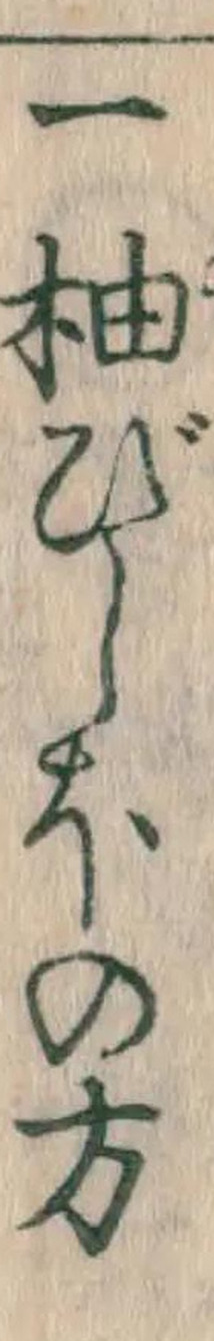一梅びしほの方
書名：広益秘事大全 3巻. [1]
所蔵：国立国会図書館 National Diet Library, JAPAN
